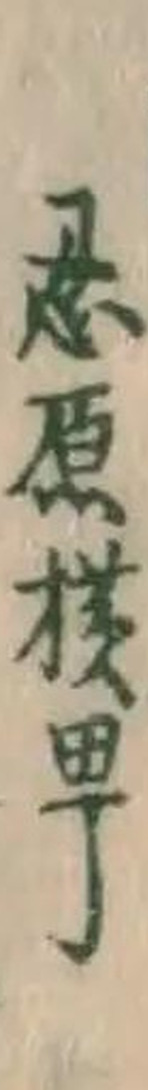忍原横町
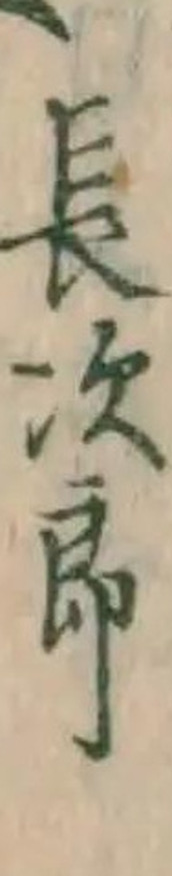長次郎
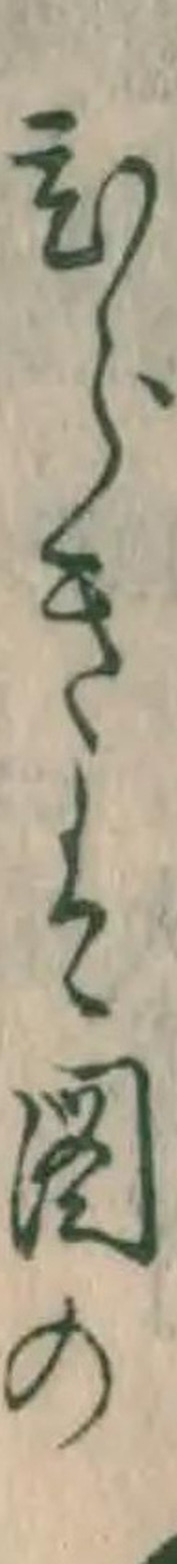ひらきは図の
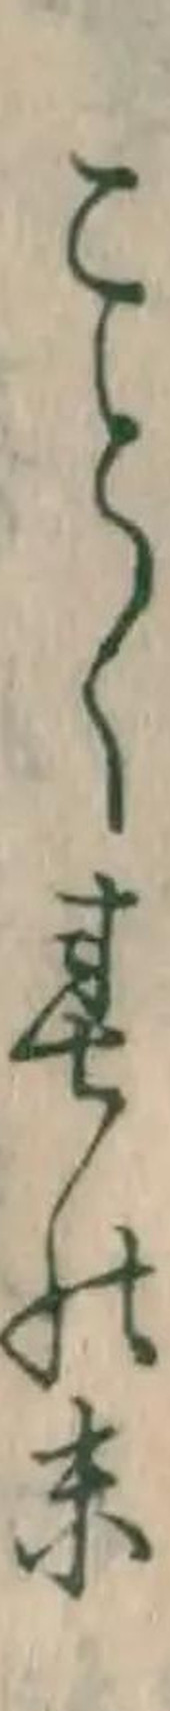ことく春の末
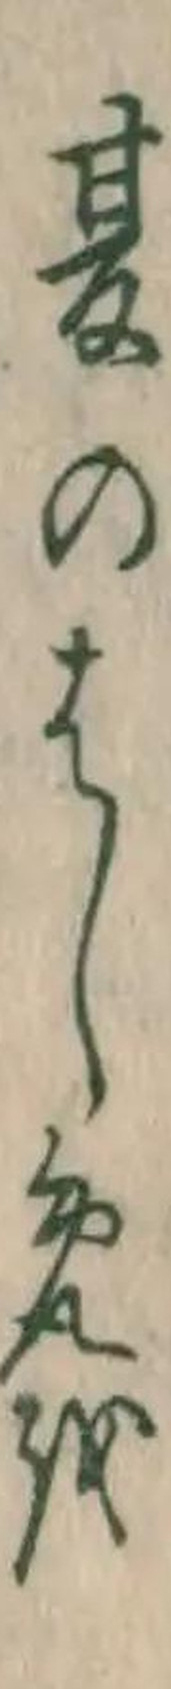夏のはしめを

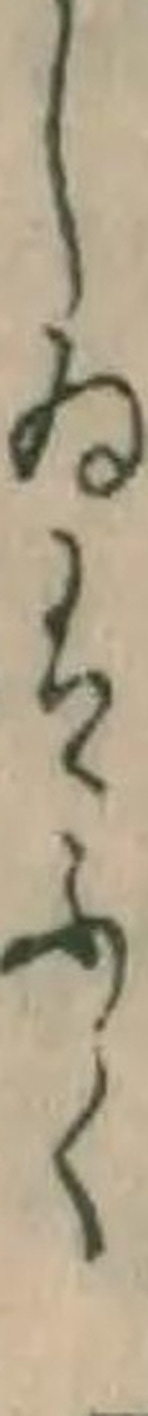しゐはふく
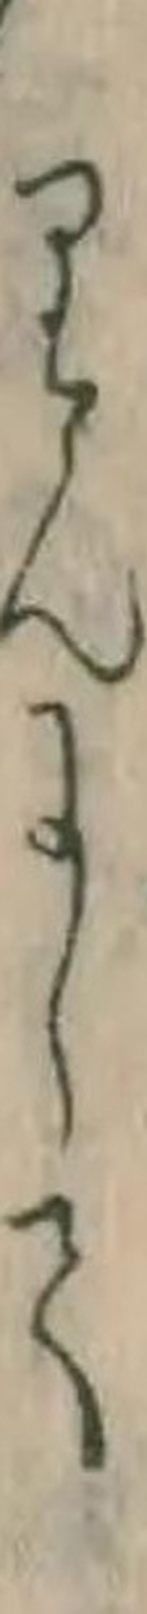りんにして
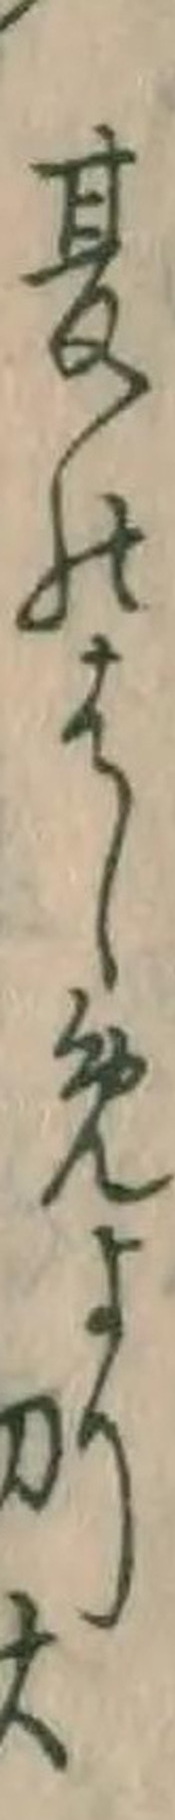夏のはしめより
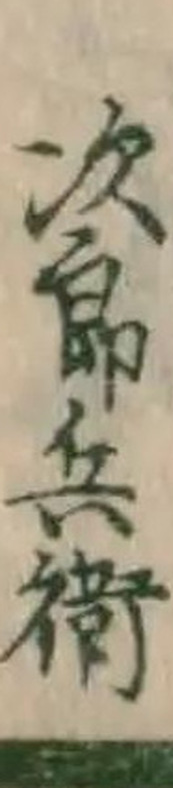次郎兵衛
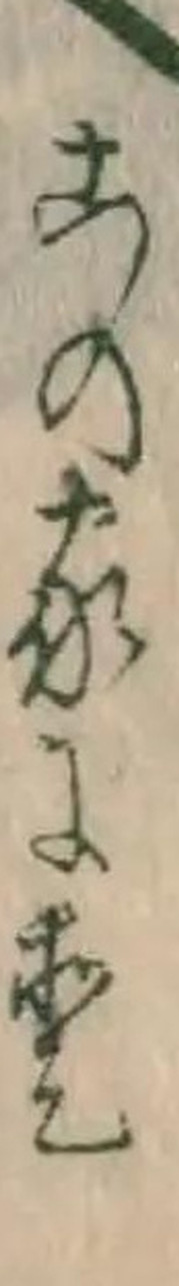この家に愛
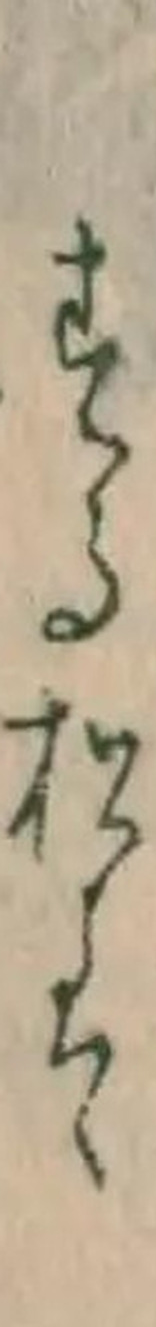する松は
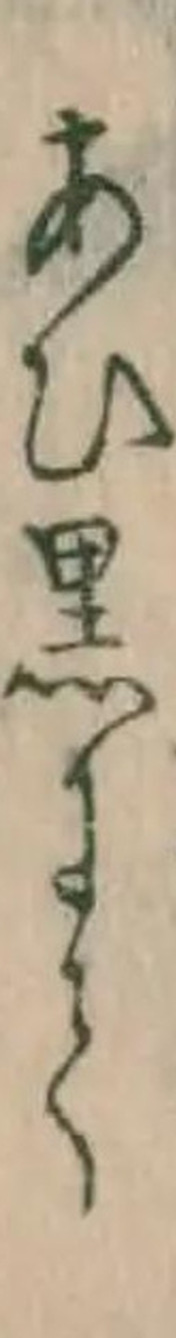あひ黒にて
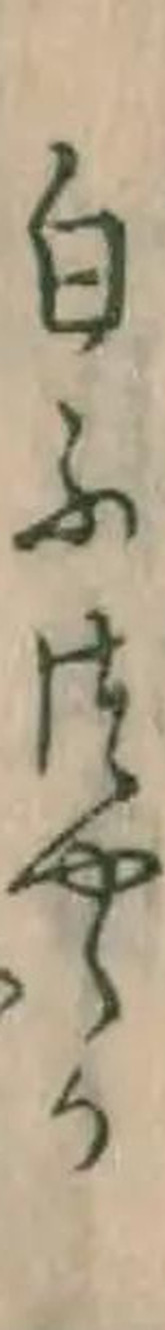白ふつやゝか
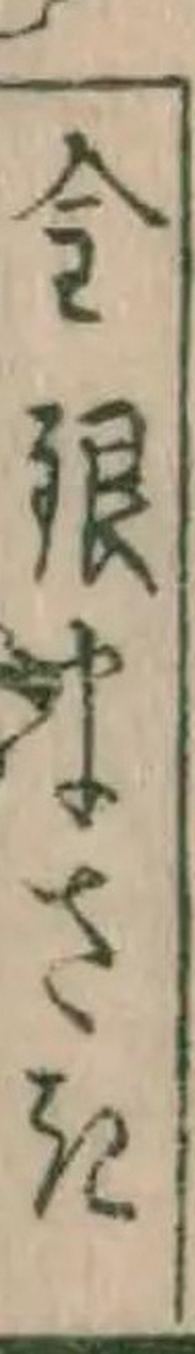金銀まさき
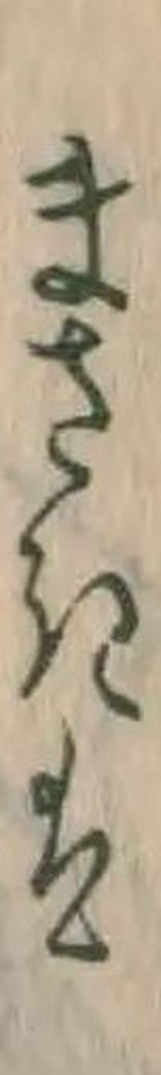まさきは
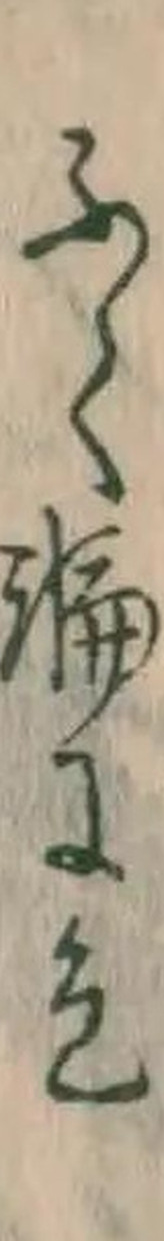ふく輪に色
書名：草木奇品家雅見 3巻. [3]
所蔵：国立国会図書館 National Diet Library, JAPAN
